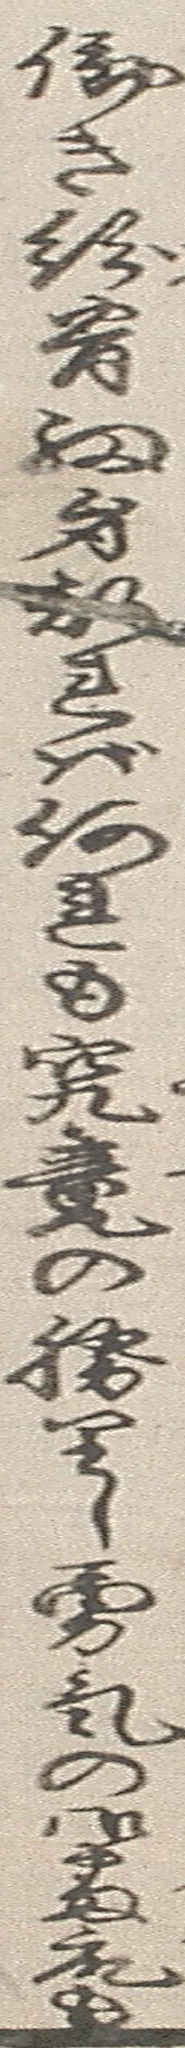働き粉細身なれバ何れも究竟の勝りし勇気の御番衆も
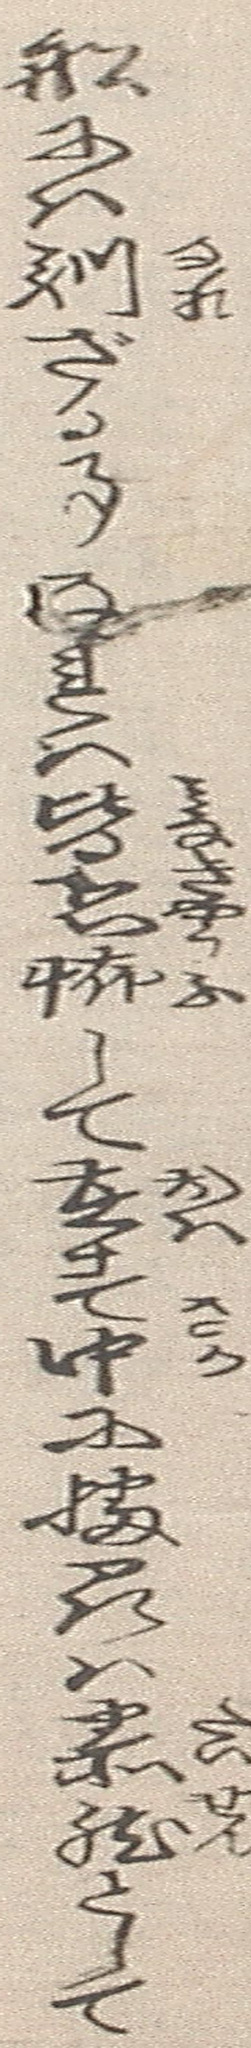船にハ馴ざる事なれバ皆恐怖して在す中に播州ハ泰然として
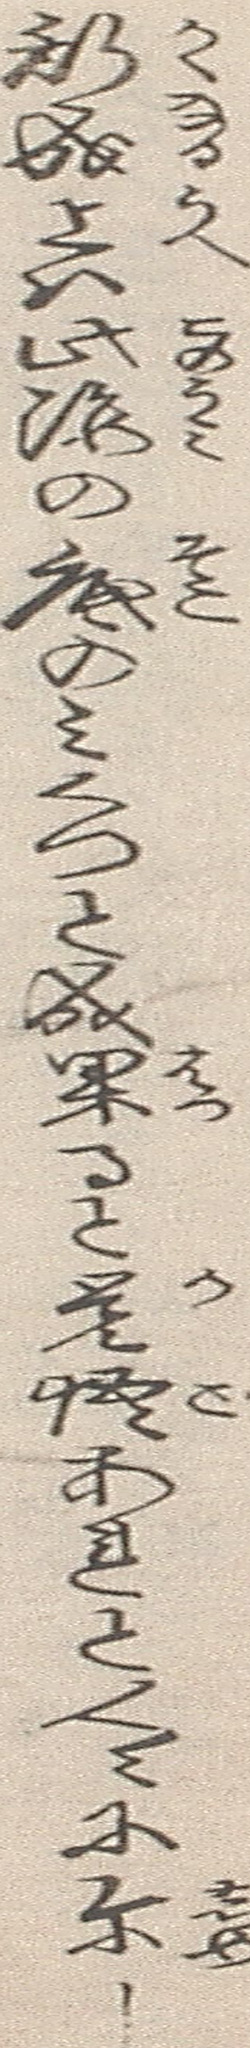斯成上ハ此海の底のミくつと成果ると覚悟あれと人々に示し
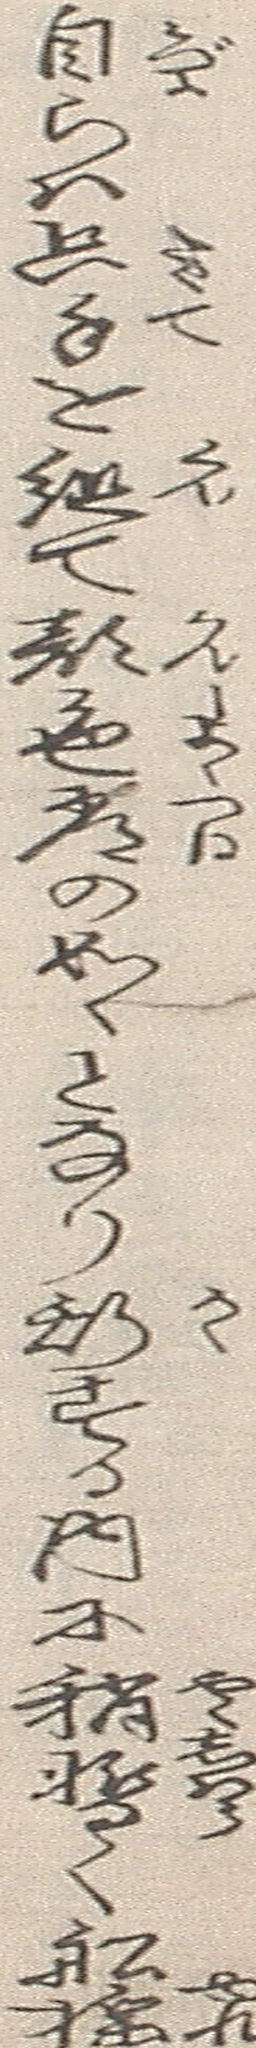自らハ只手を組て顔色常の如くとなり斯する内に稍暫く船揺
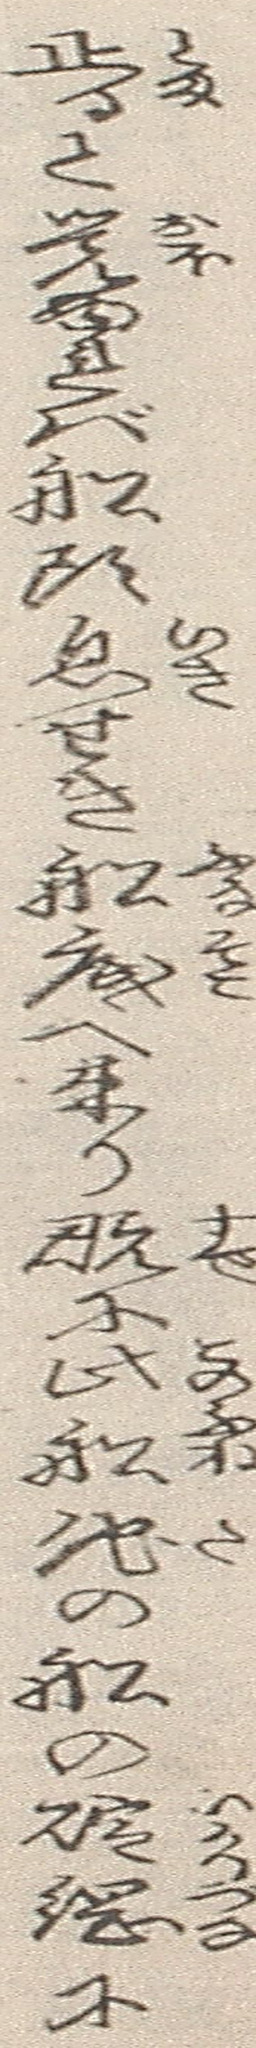止ると覚ゆれバ船頭息せき船底へ来り既に此船他の船の碇綱に
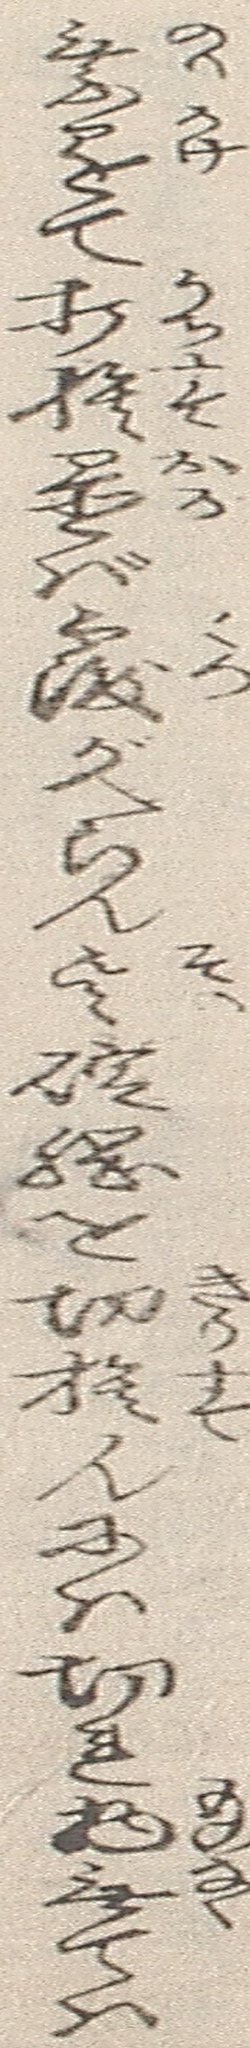乗懸て打捨置バ覆がへらん其碇綱を切捨んにハ切れ物無てハ
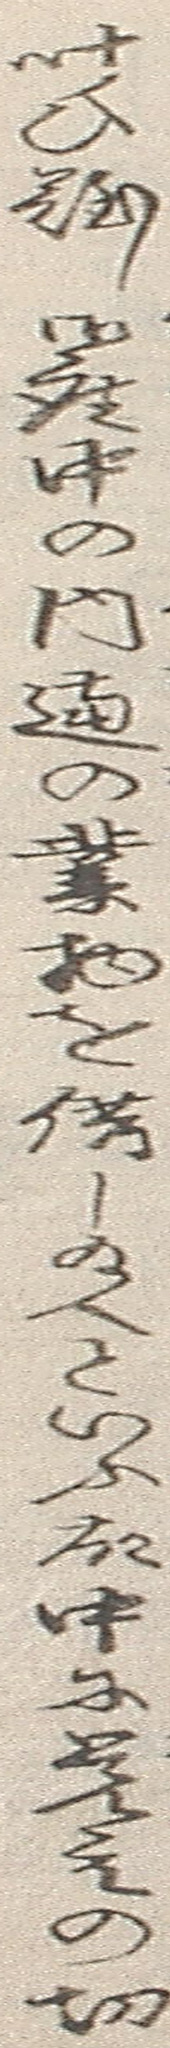叶ひ難し御座中の内適の業物を借し給へといふ故中に覚えの切
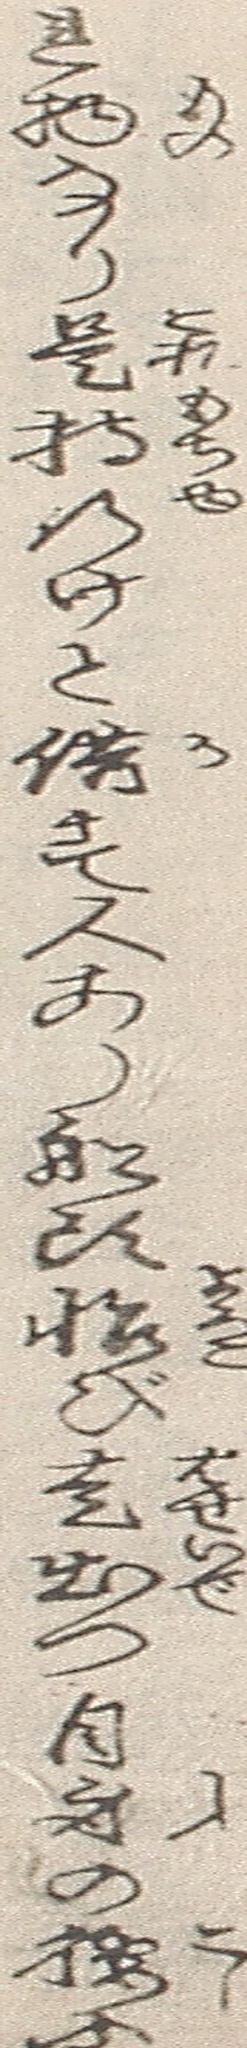れ物なり是持行けと借す人あり船頭悦び走出つ自身の腰に
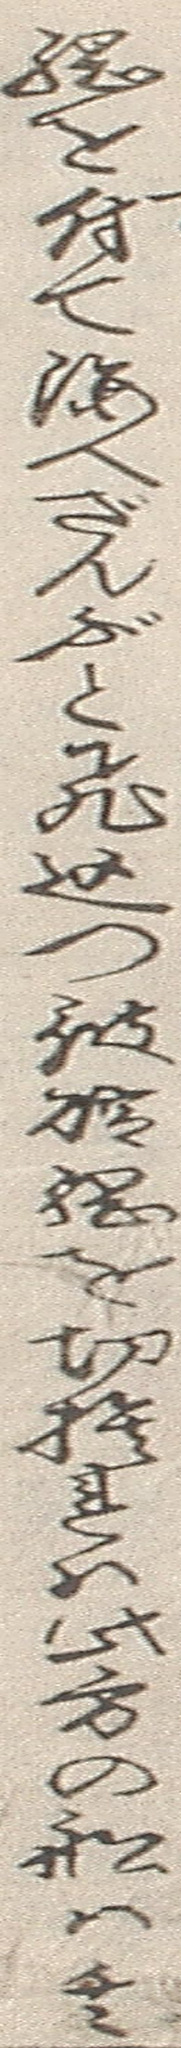縄を付て海へざんぶと飛込つ彼碇綱を斬捨れハ此方の船ハ其
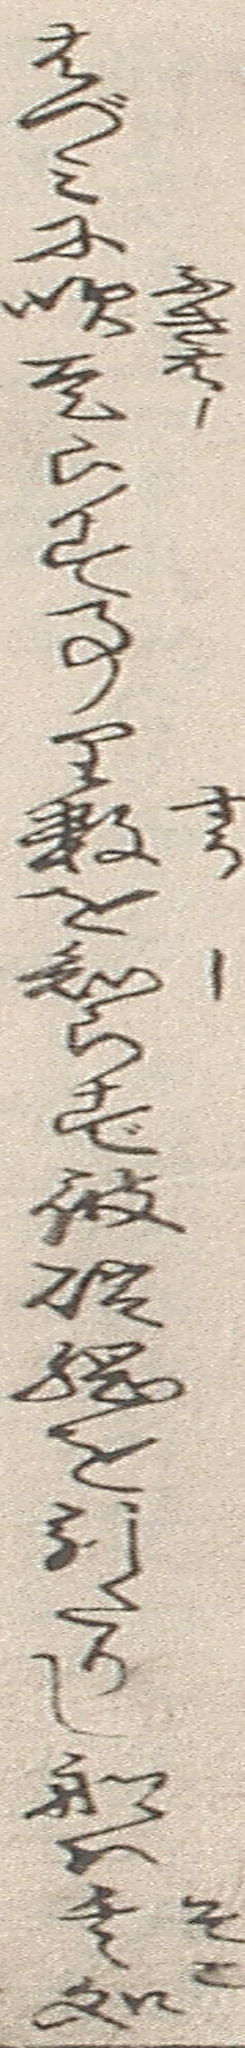はずミに吹走らす事里数を知らず彼碇綱を引たりし船ハ其処
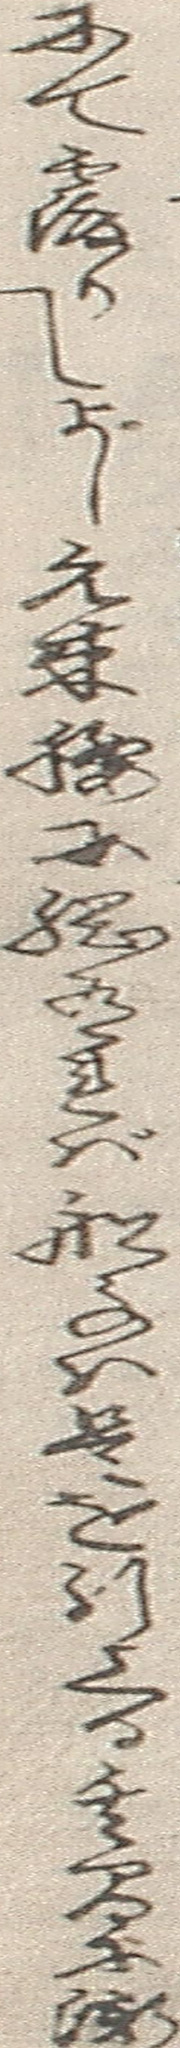にて覆りしよし元来腰に綱あれバ船子ハ是を引上る其間に漸
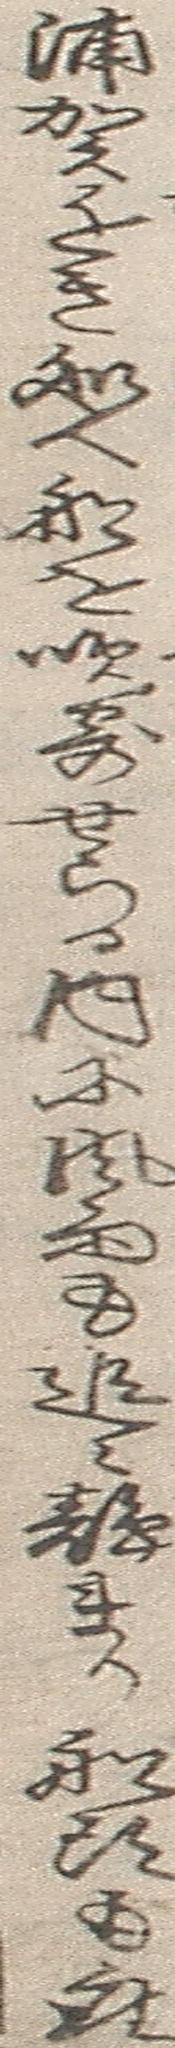浦賀近き処へ船を吹寄せらる内に風雨も追々静まり船頭も座

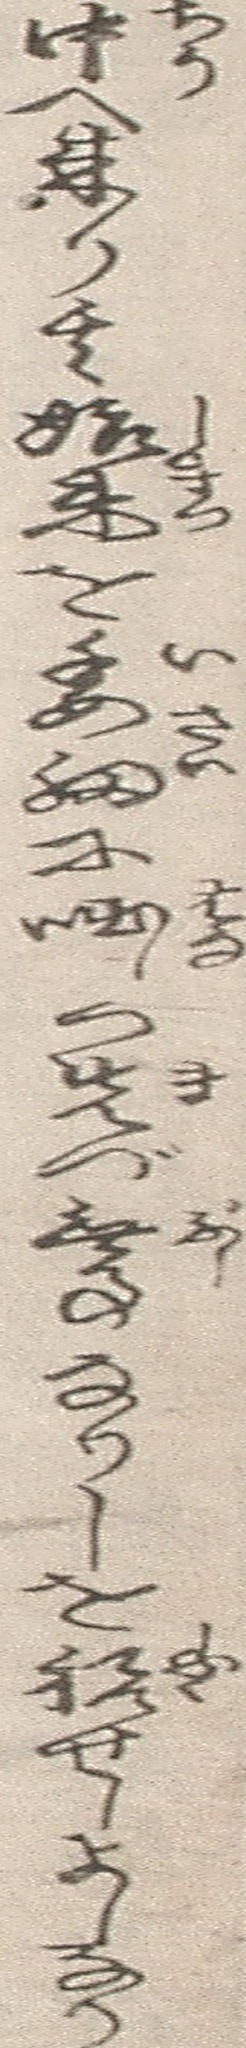中へ来り其始末を委細に咄しつ先づ無事なりしを祝せしよしなり
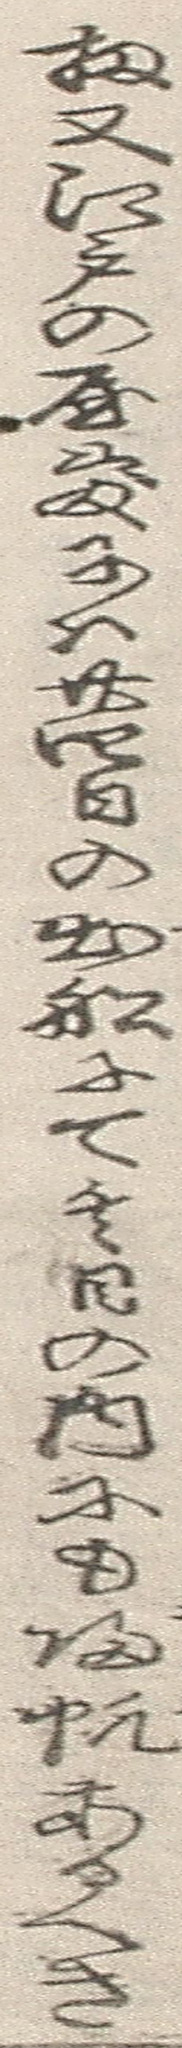扨又江戸の屋敷にハ廿四日の出船にて其日の内にも帰帆あるへき
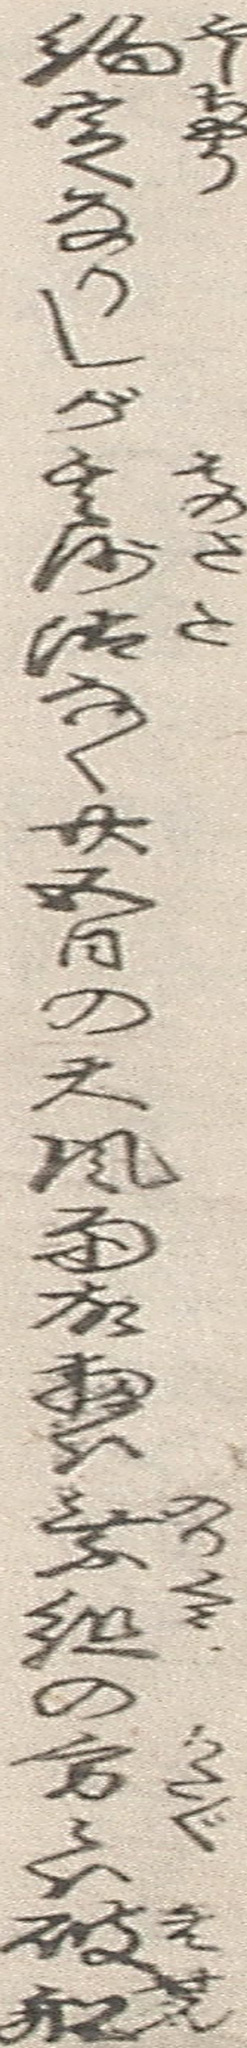約定なりしが其沙汰なく廿五日の大風雨故扨ハ乗組の方々ハ破船
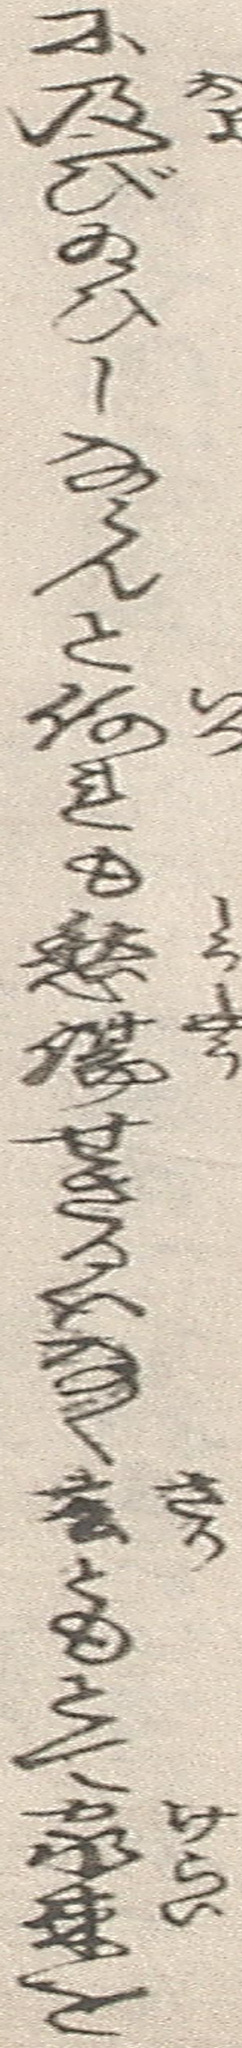に及び給ひしならんと何れも愁傷せさるハなく去ともとて家来を
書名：安政風聞集　上中下　全
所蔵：東京大学地震研究所図書室 Earthquake Research Institute Library, The University of Tokyo, JAPAN
